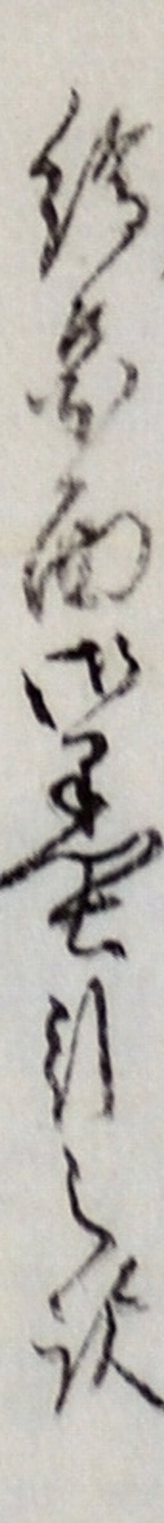絵図面御墨引之訳
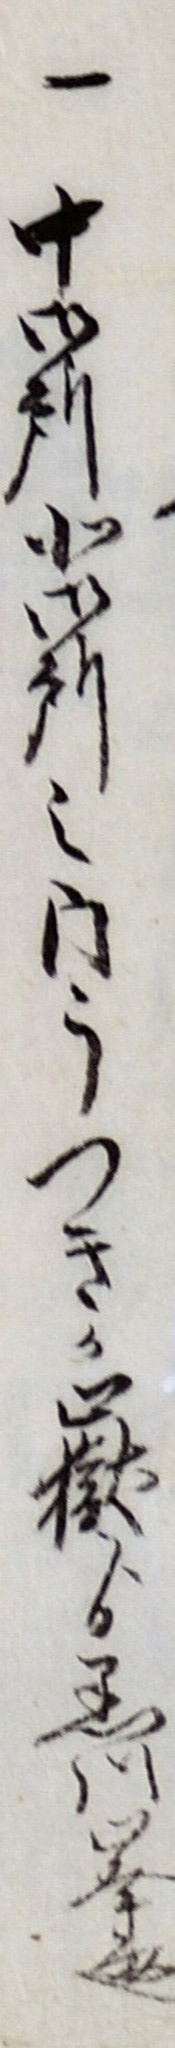一中御所北御所之内うつきか嶽より黒川峯通
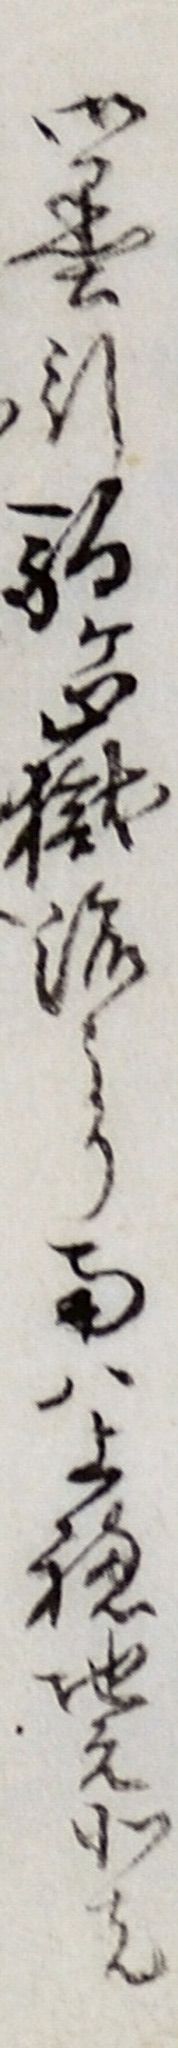御墨引駒ヶ嶽流より南ハ上穂地元北は
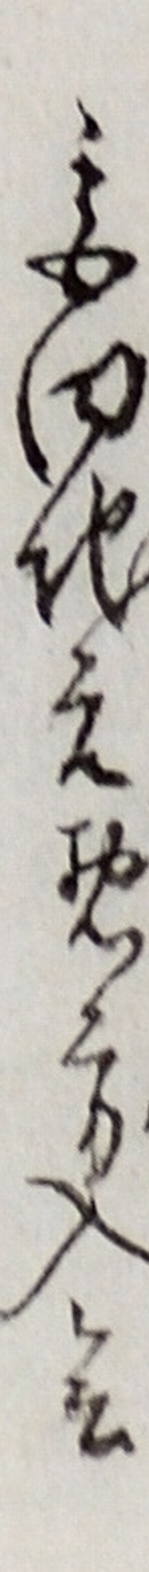宮田地元総方入会
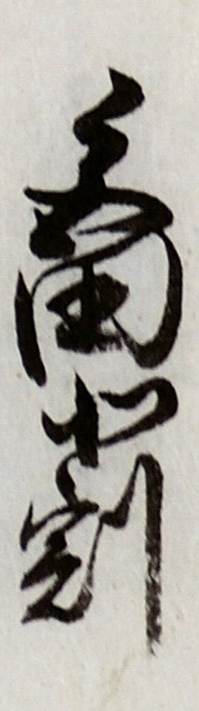宮田北割
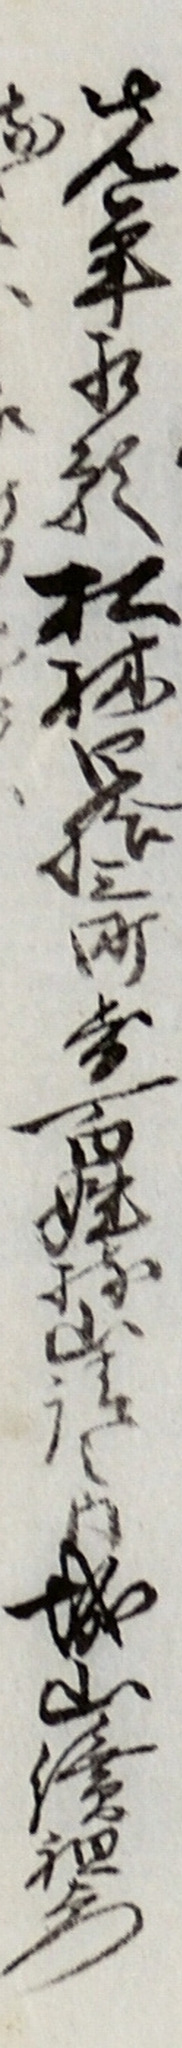先年相願松林四拾三町歩百姓持山請之内城山続祖右衛門
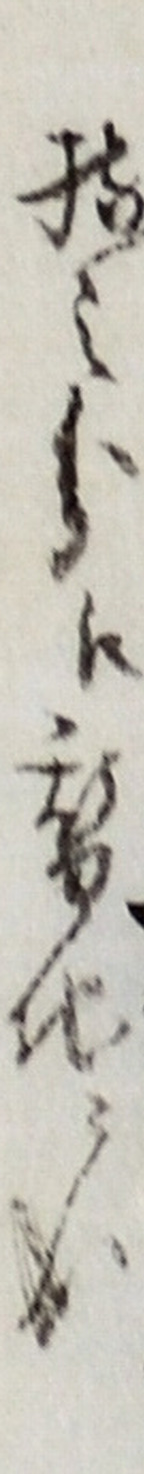持之分え替地ニ成
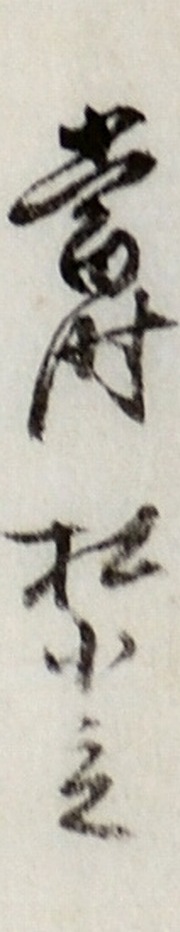当時松小立
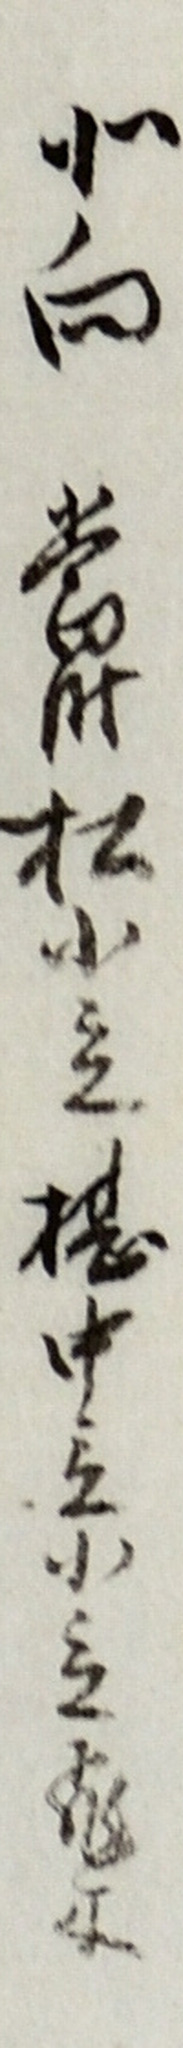北向当時松小立椹中立小立飛木
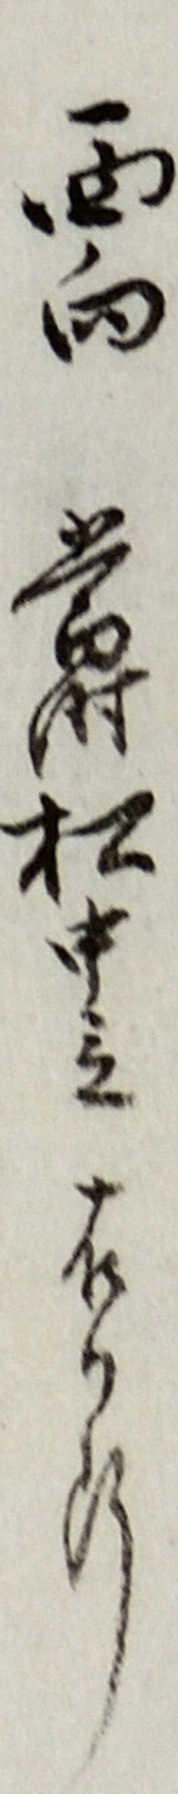西向当時松中立右同断
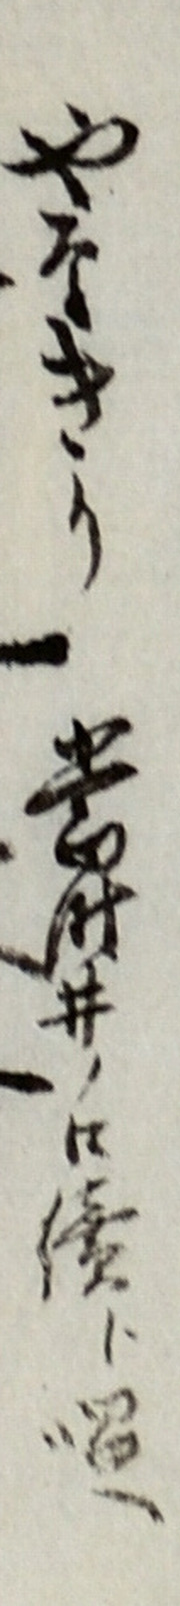やなきり当時井ノ口続唱へ
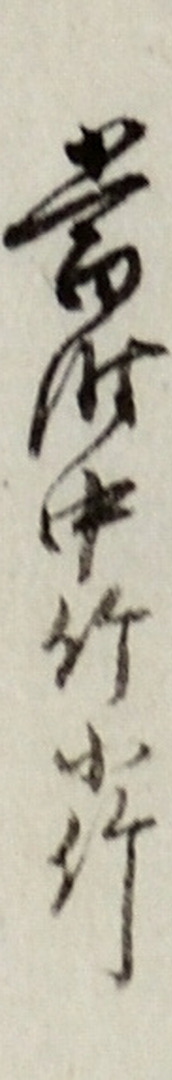当時中竹小竹
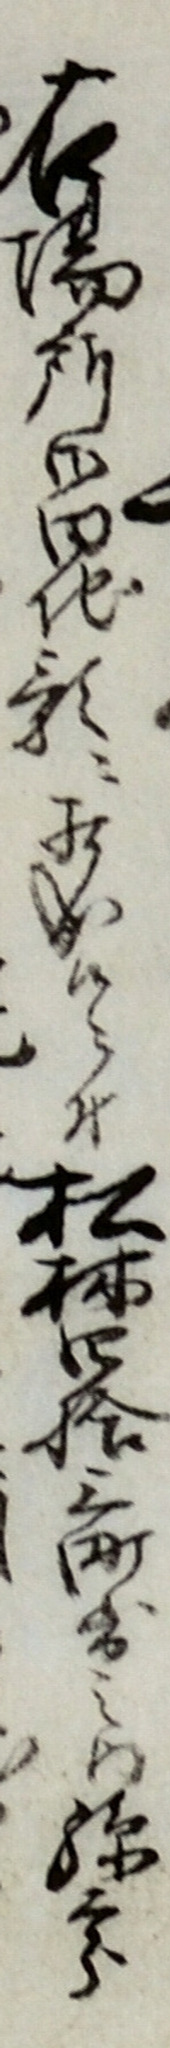右場所御田地影ニ相成候ニ付松林四拾三町歩之内孫右衛門
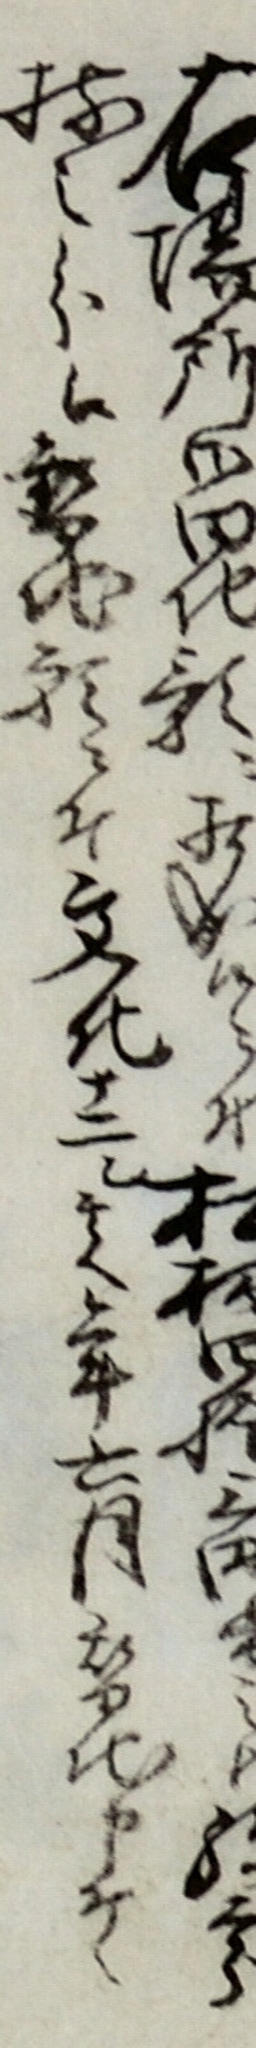持之分え替地願ニ付文化十二乙亥年六月替地申付候
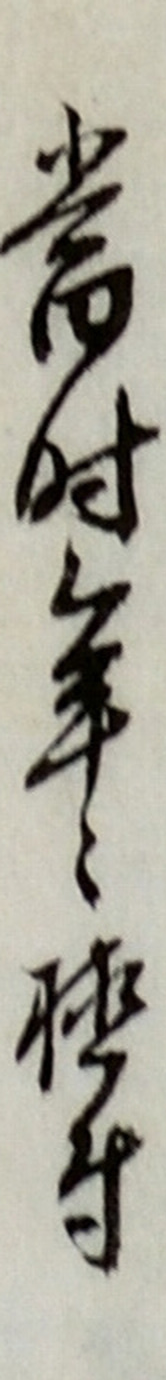当時年々植付

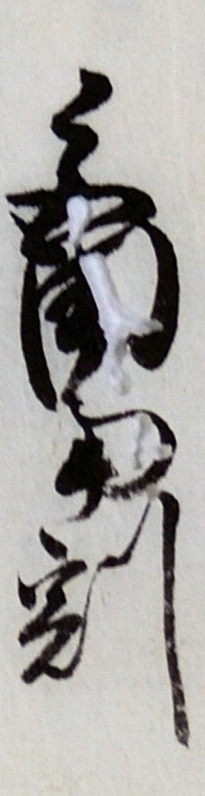宮田南割
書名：郷中御林御竹薮名所附守之名前帳
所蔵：伊那市立高遠町図書館・合同会社AMANE
